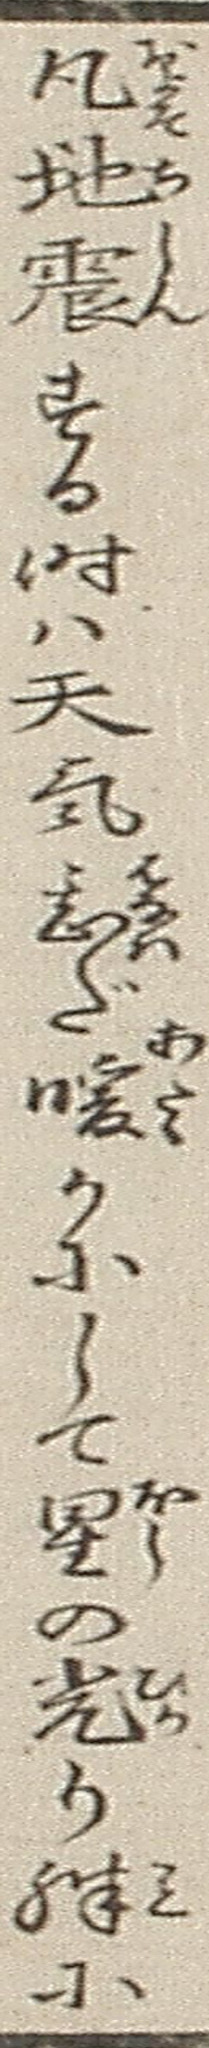凡地震する時は天気甚だ暖かにして星の光り殊に
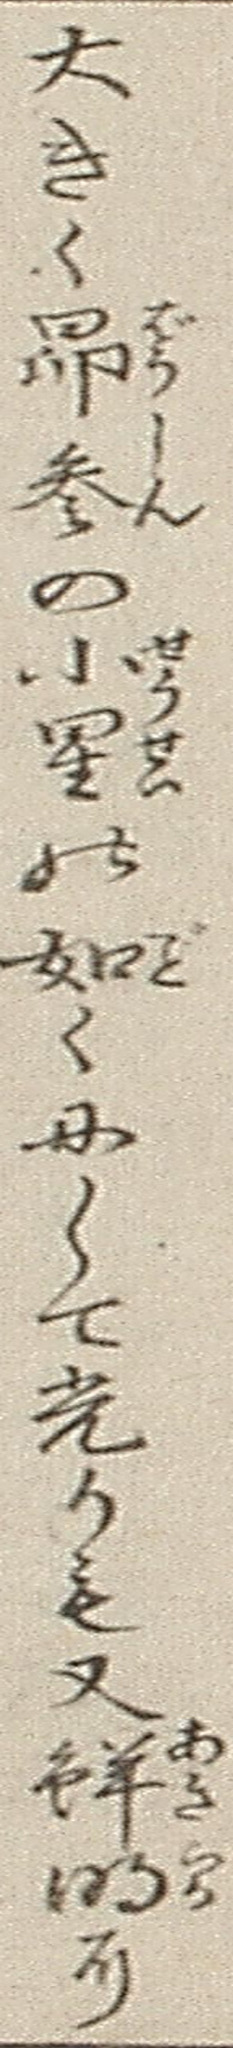大きく昴参の小星の如くにして光りも又鮮明に
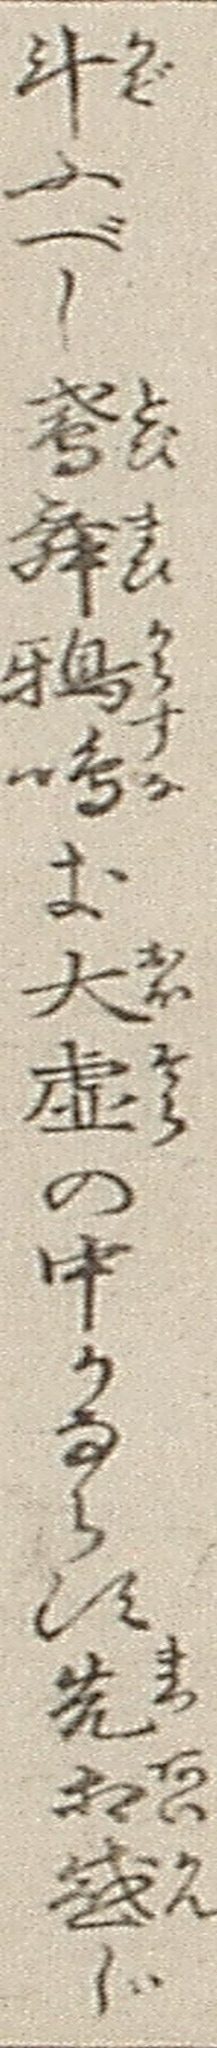斗ふべし鳶舞鴉鳴き大虚の中かならす先相感じ
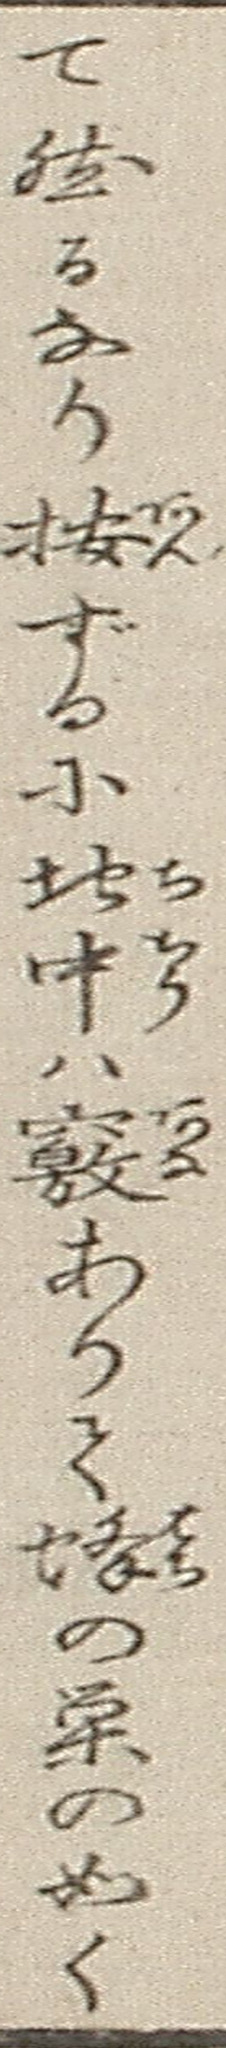て然るなり按ずるに地中は竅ありて蜂の巣の如く

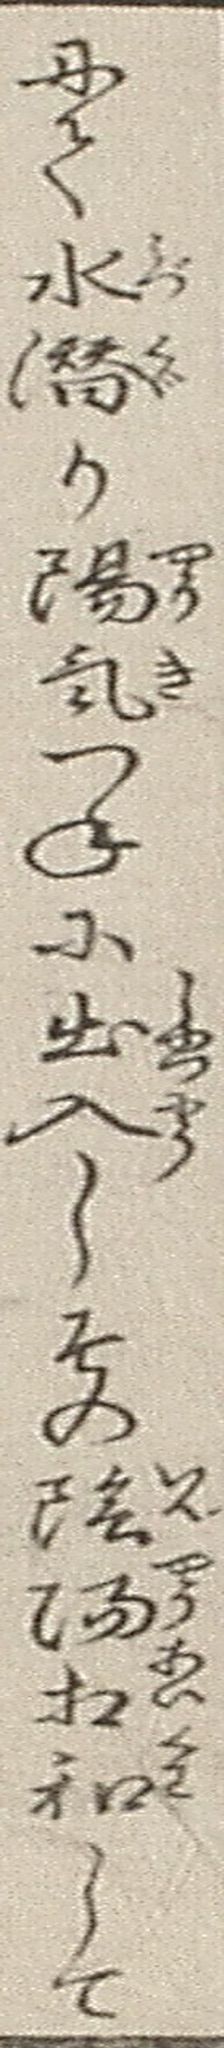にて水潜り陽気つねに出入しその陰陽相和して
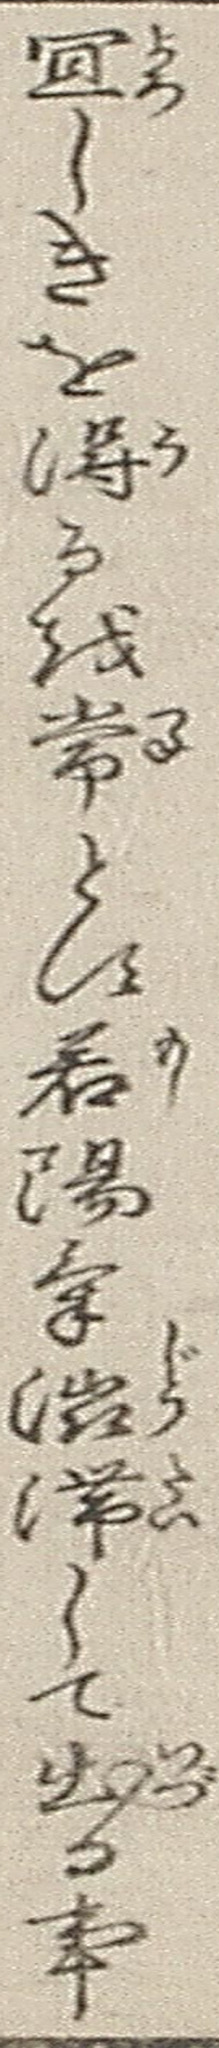宜しきを得るを常とす若陽気渋滞して出る事
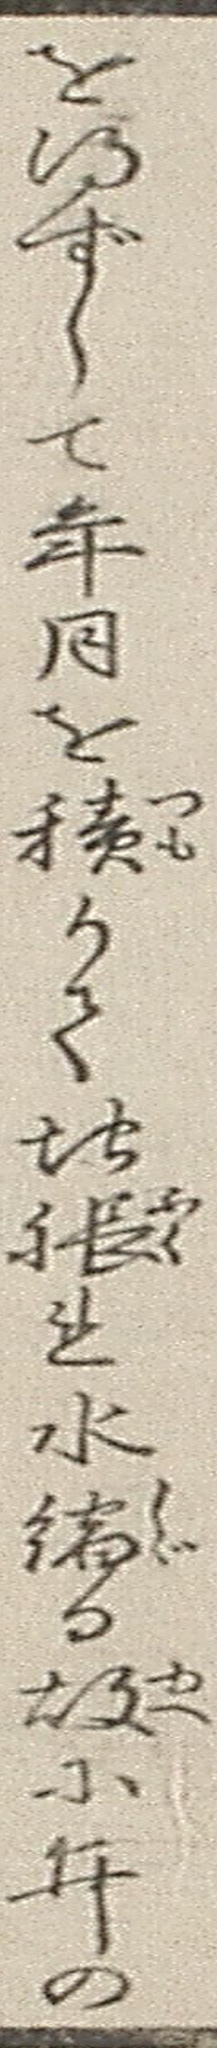を得ずして年月を積りて地脹れ水縮る故に井の
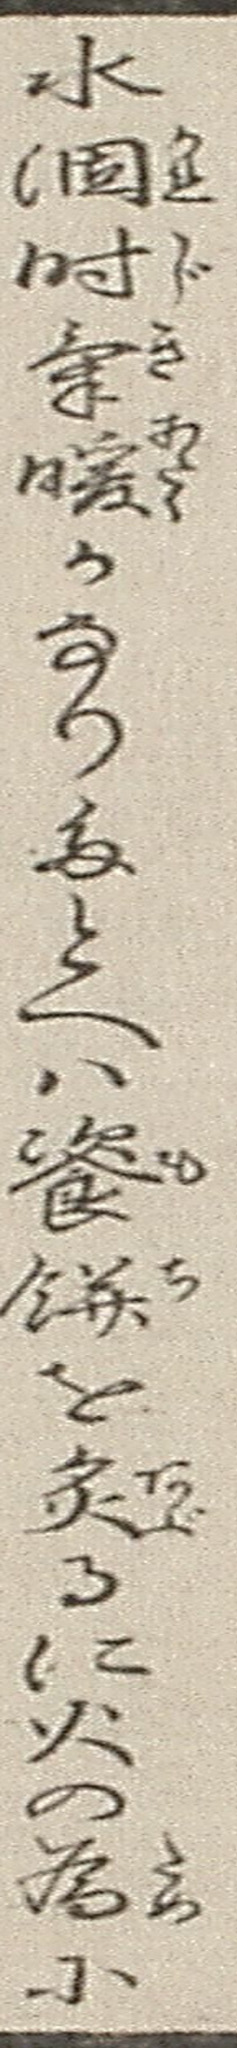水涸時気暖かなりたとへは餈餅を炙るに火の為に
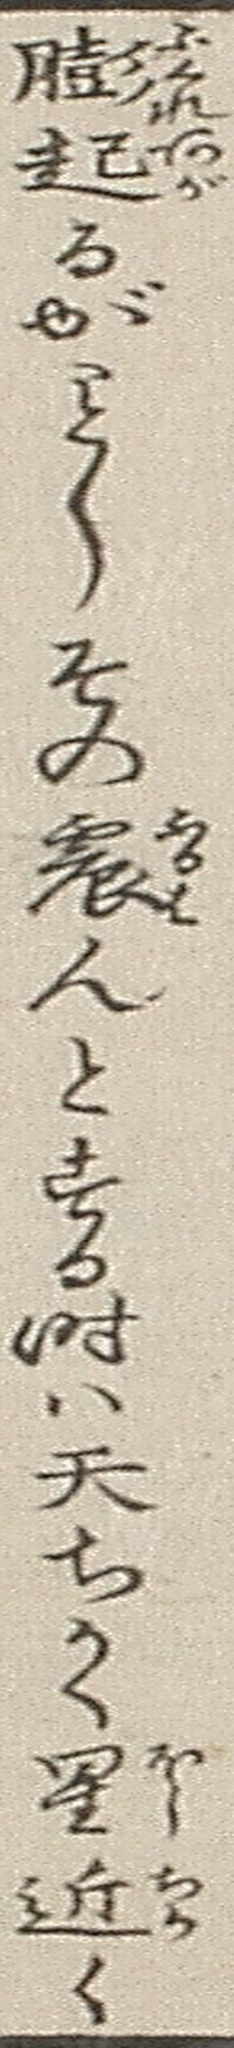膨起るがごとしその震んとする時は天ちかく星近く
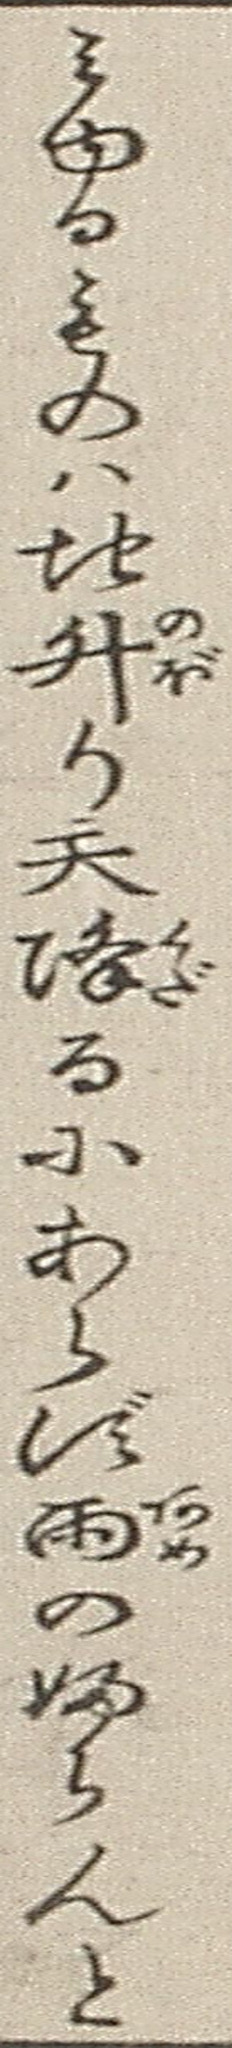みゆるものは地升り天降るにあらず雨のふらんと
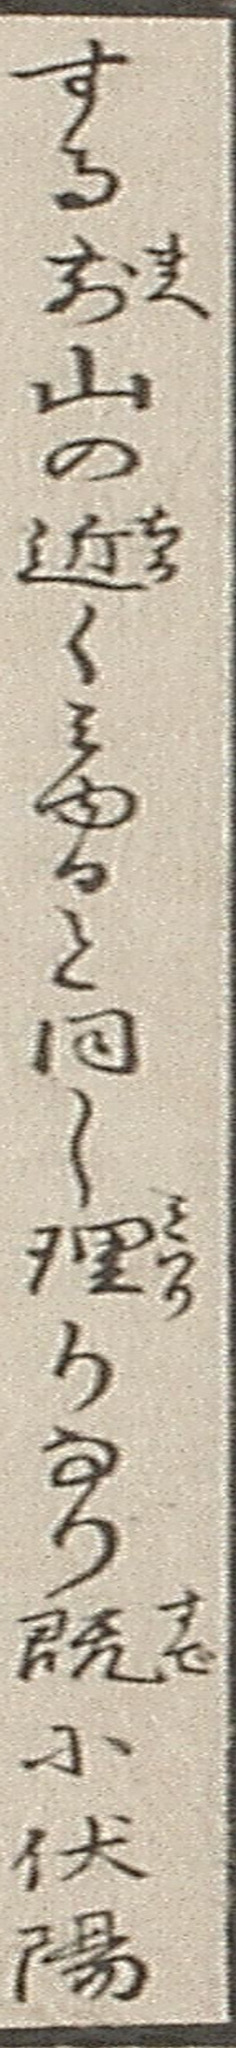する前山の近くみゆると同し理なり既に伏陽
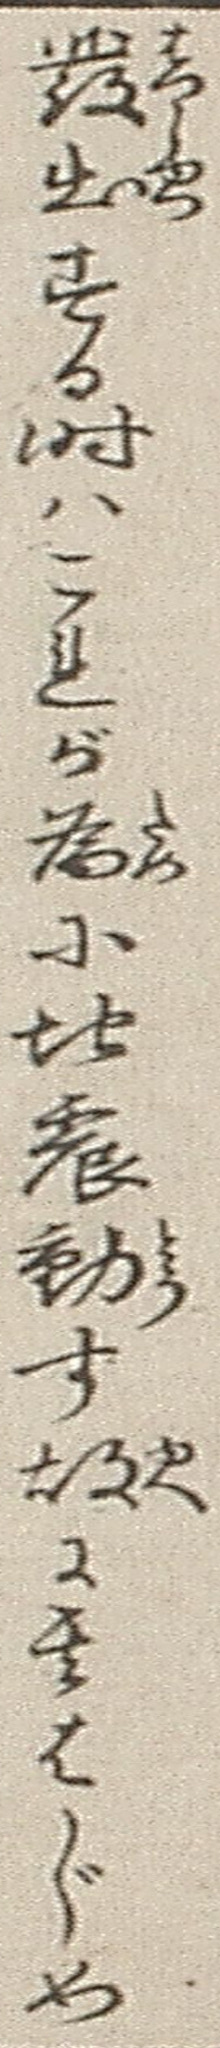発出する時はこれが為に地震動す故に其はじめ

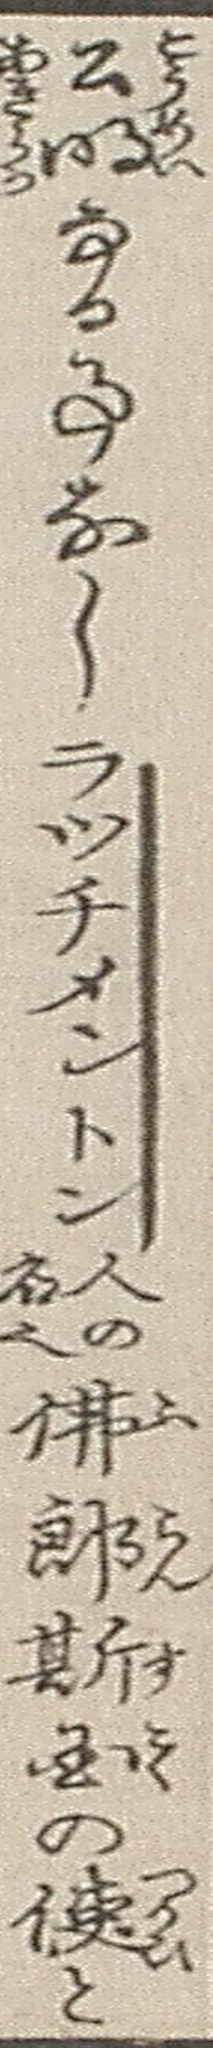公明なる事なしラツチメントン人の名也佛郎斯国の使と
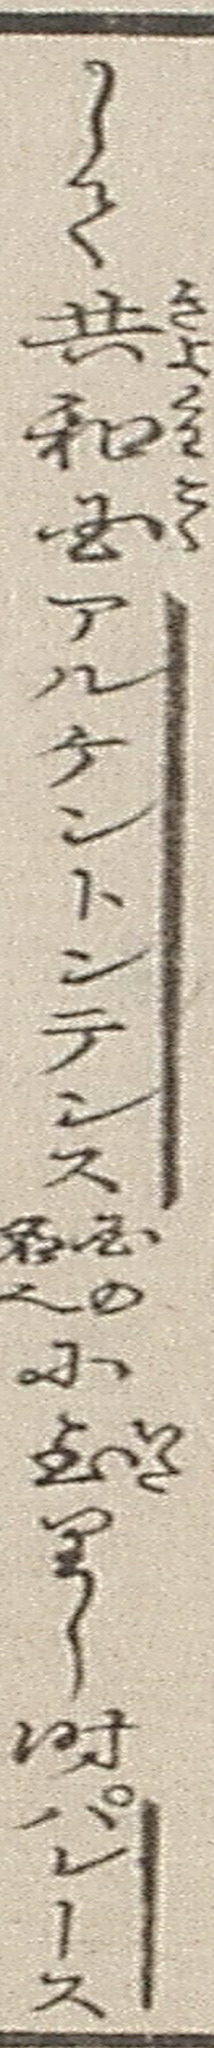して共和国アルケントンテンス国の名也に至りし時パレース
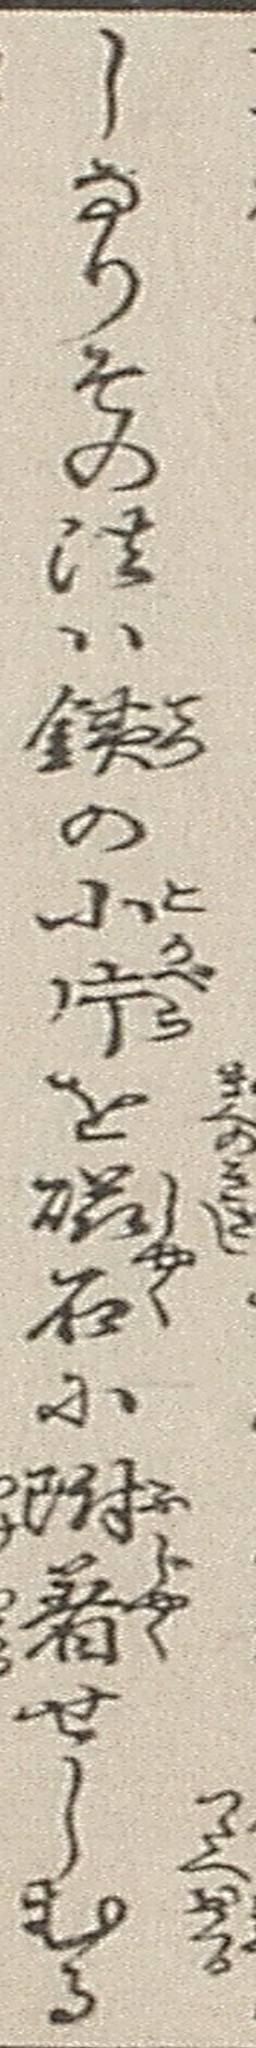しなりその法は鉄の小片を磁石に附着せしむる
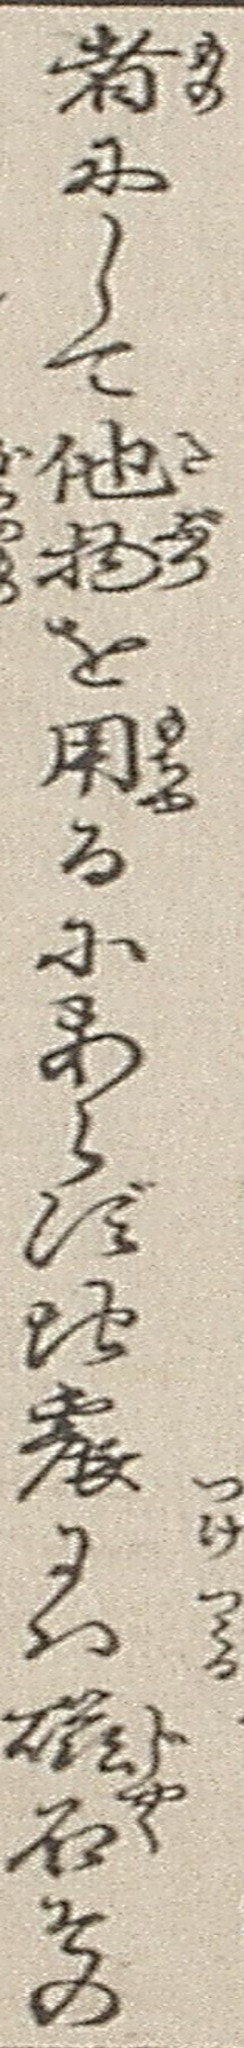者にして他物を用るにあらず地震には磁石その
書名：大地震暦年考　全
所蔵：東京大学地震研究所図書室 Earthquake Research Institute Library, The University of Tokyo, JAPAN
